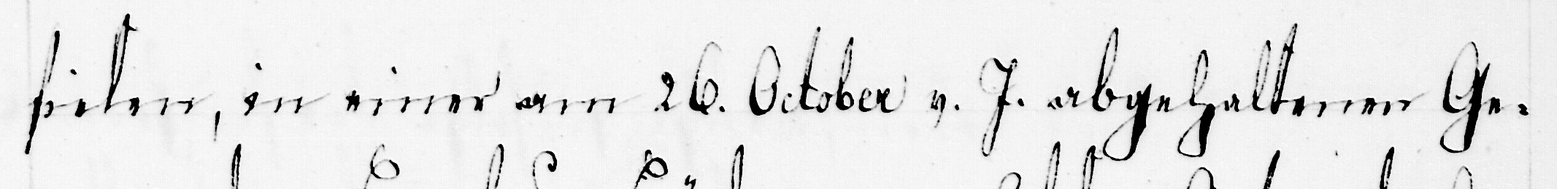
fielen, in einer am 26. October v. J. abgehaltenen Ge¬
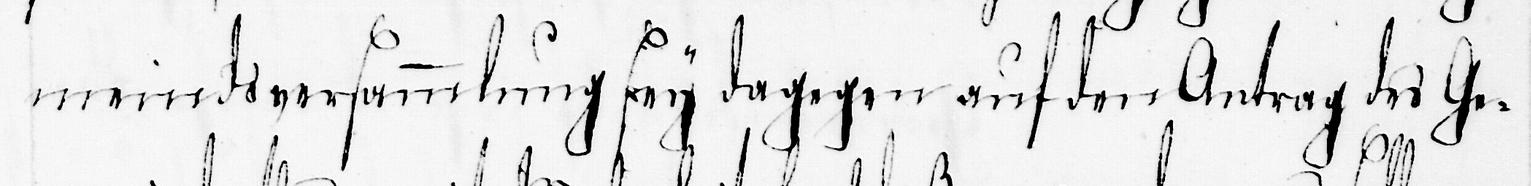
meindsversammlung sey dagegen auf den Antrag des Ge¬
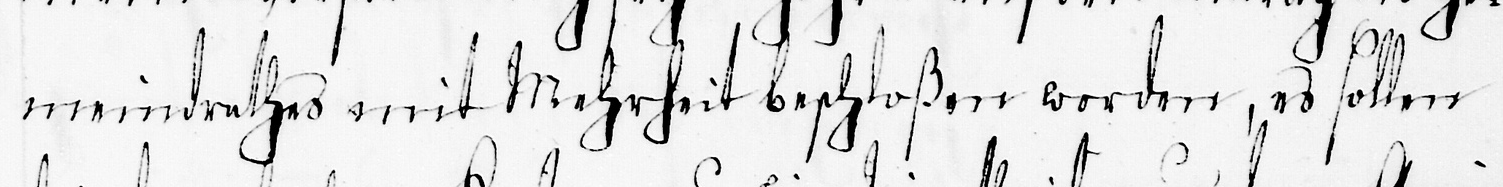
meindrathes mit Mehrheit beschloßen worden, es sollen
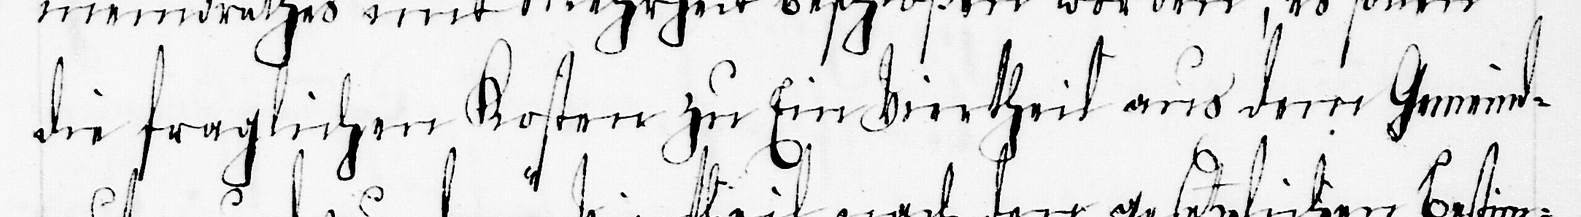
die fraglichen Kosten zu Ein Viertheil aus dem Gemeind¬
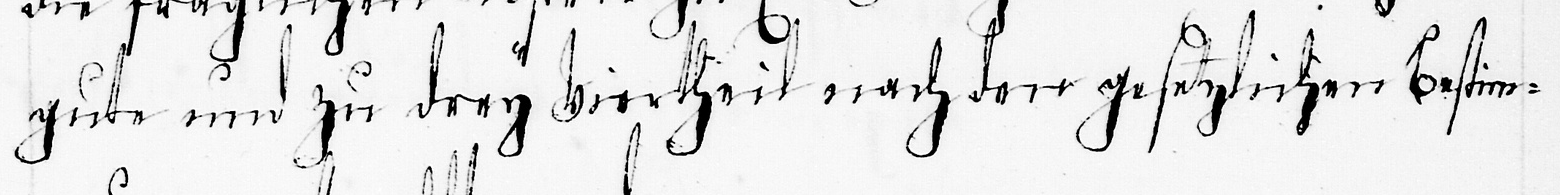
gute und zu drey Viertheil nach den gesetzlichen Bestim¬
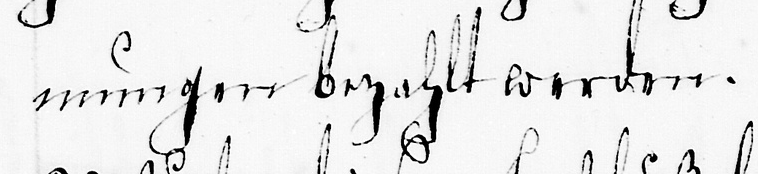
mungen bezahlt werden.
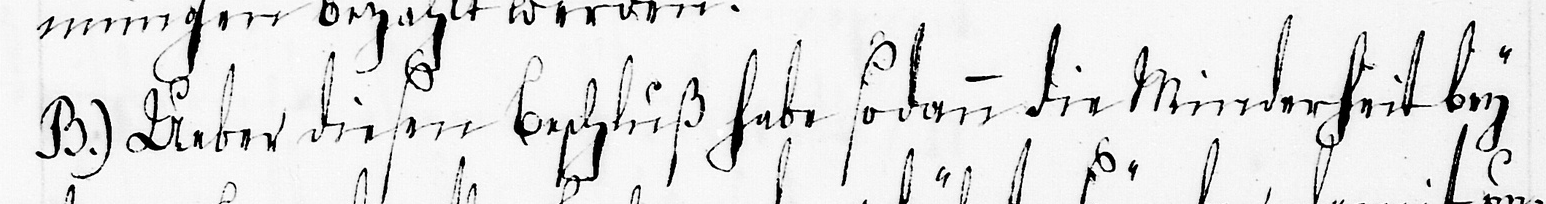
B.) Ueber diesen Beschluß habe sodann die Minderheit bey
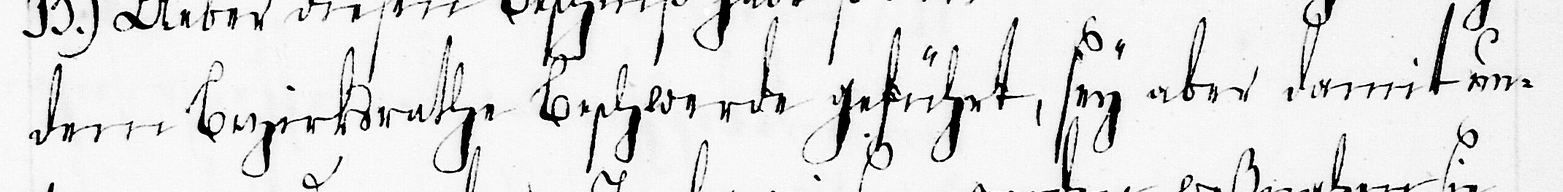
dem Bezirksrathe Beschwerde geführt, sey aber damit un¬
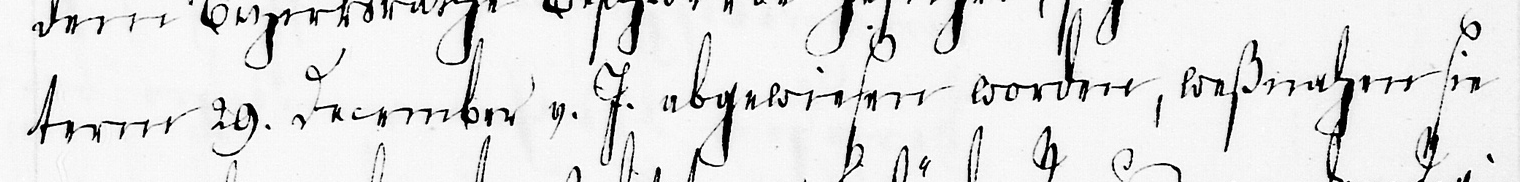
term 29. December v. J. abgewiesen worden, weßnahen sie
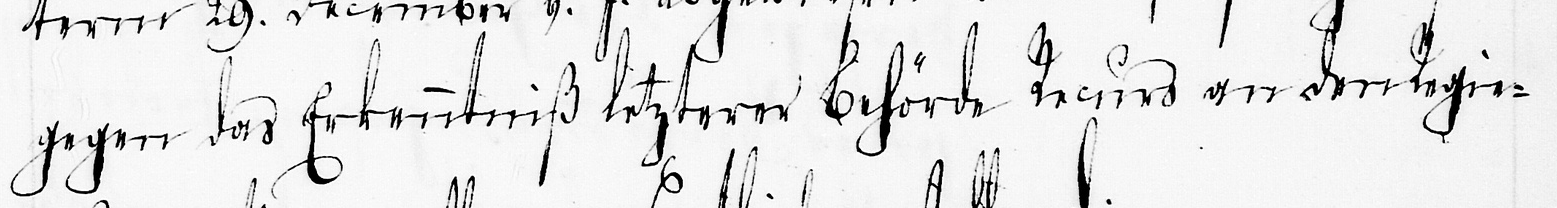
gegen das Erkenntniß letzterer Behörde Recurs an den Regie¬
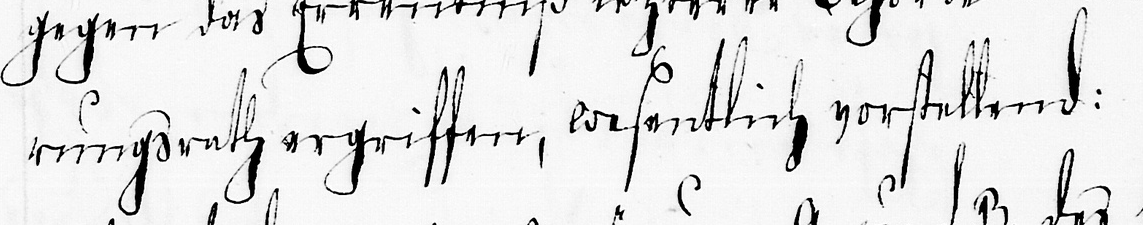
rungsrath ergriffen, wesentlich vorstellend:
